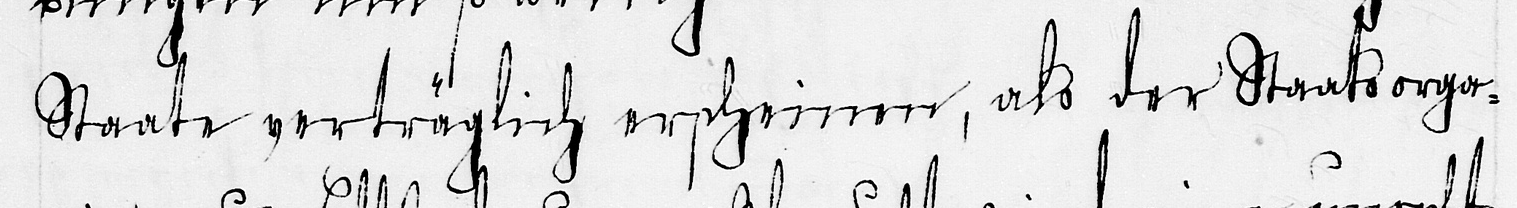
Staate verträglich erscheinen, als der Staatsorga¬
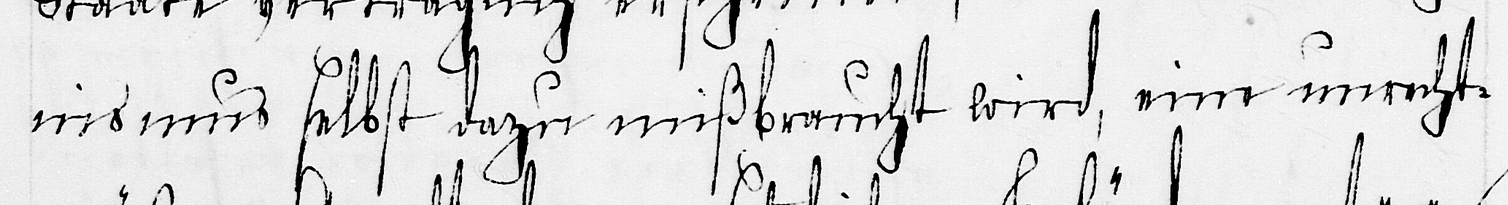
nismus selbst dazu mißbraucht wird, eine unrecht¬
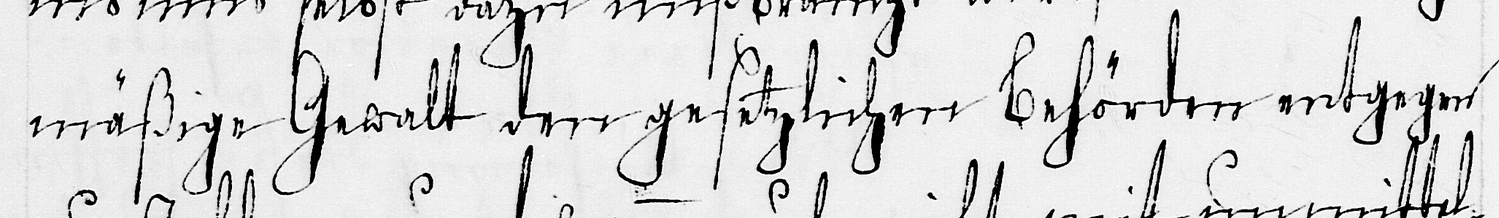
mäßige Gewalt den gesetzlichen Behörden entgegen
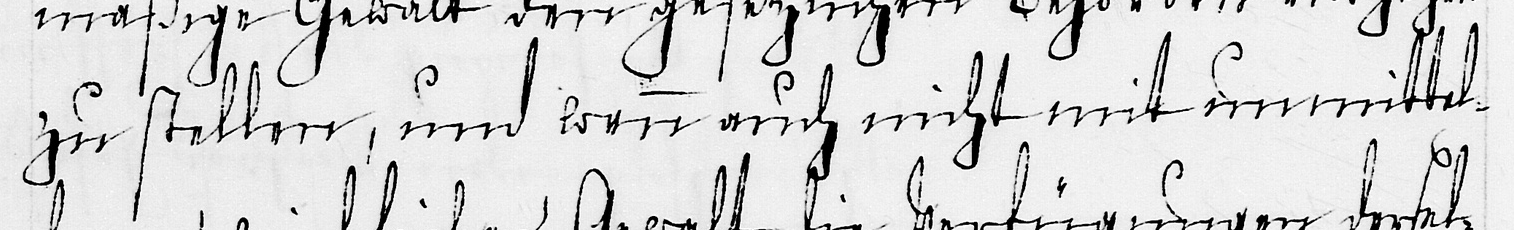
zu stellen, und wenn auch nicht mit unmittel¬
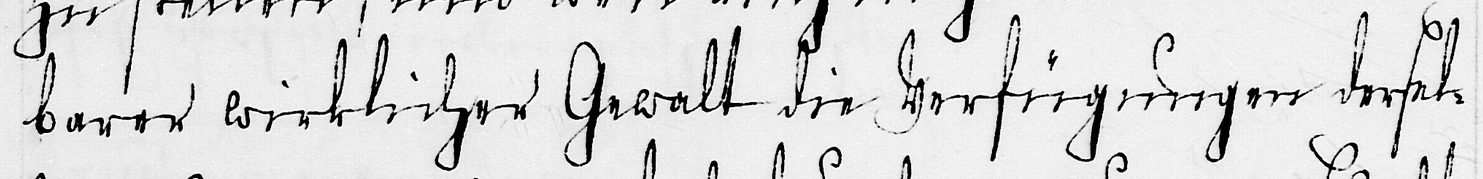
barer wirklicher Gewalt die Verfügungen dersel¬
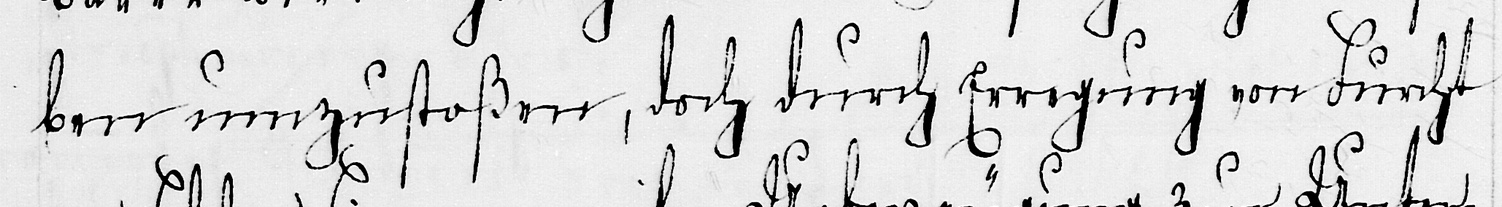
ben umzustoßen, doch durch Erregung von Furcht
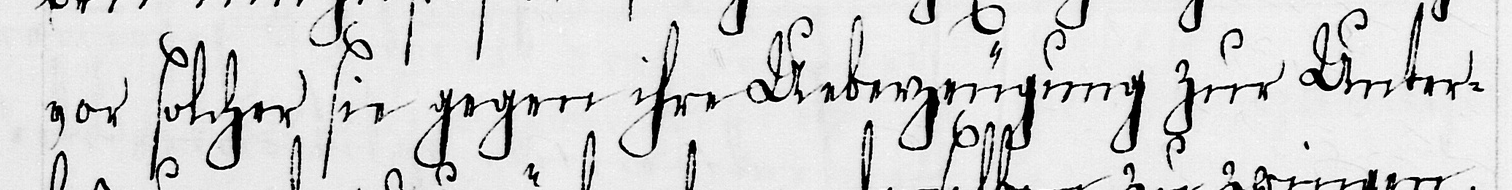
vor solcher sie gegen ihre Ueberzeugung zur Unter¬
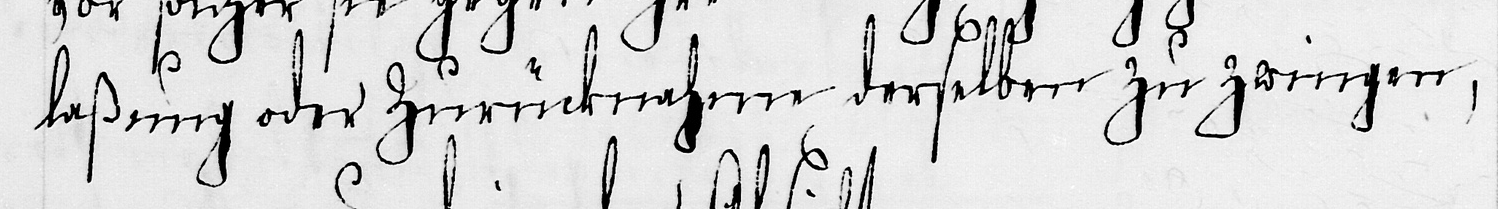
laßung oder Zurücknahme derselben zu zwingen,
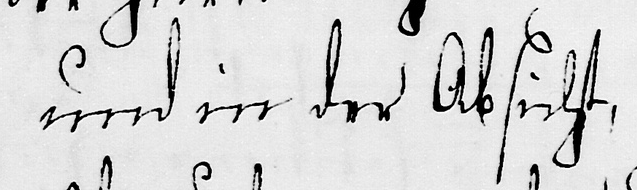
und in der Absich¬
